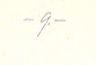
-9.-
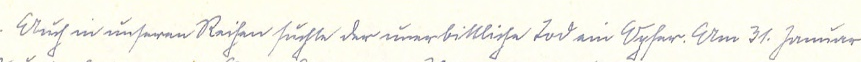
Auch in unserer Reihe suchte der unerbittliche Tod ein Opfer. Am 31. Am 31. Jänner
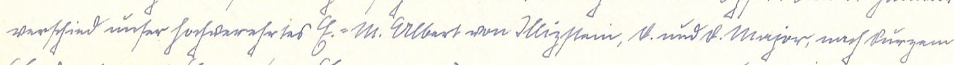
verschied unser hochverehrtes E.-M. Albert von Illizstein, k. und k. Major, nach kurzem
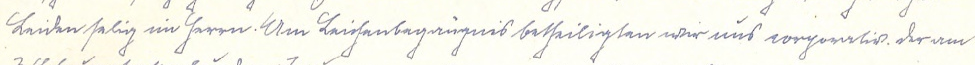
Leiden selig im Herrn. Am Leichenbegräbnis betheiligten wir uns corporatis. Der
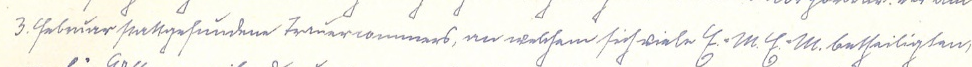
am 3. September stattgefundene Trausercommers, an welchem sich viele E.-M. E.-M. betheiligten,
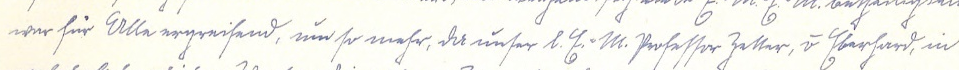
war für Alle ergreifend, um so mehr, da unser l. E.-M. Professor Zetter, v/o Eberhard, in
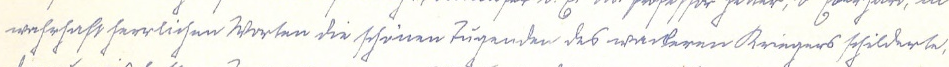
wahrhaft herrlichen Worten die schönen Tugenden des wackeren Kriegers schilderte,
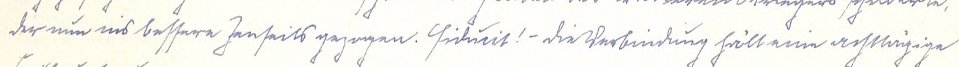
der nun ins bessere Jenseits gegangen. Fiducit! - Die Verbindung hält eine achttägige
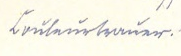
Couleurtrauer.
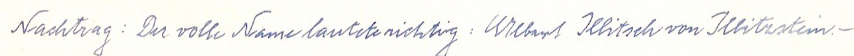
Nachtrag: Der volle Name lautete richtig: Albert Illitsch von Illitzstein. -
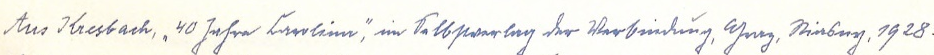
Aus Kresbach, "40 Jahre Carolina", im Selbstverlag der Verbindung, Graz, Stiersxxx, 1928:
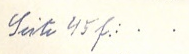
Seite 45 f.:
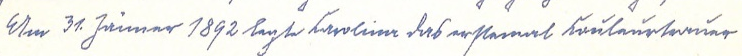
Am 31. Jänner 1892 legte Carolina das erstemal Couleurtrauer
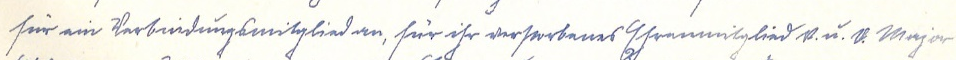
für ein Verbindungsmitglied an, für ihr verstorbenes Ehrenmitglied k. u. k. Major
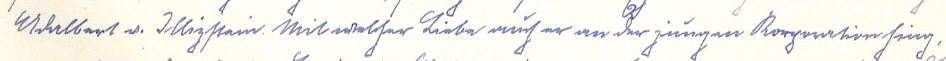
Adalbert v. Illizstein. Mit welcher Liebe auch er an der jungen Korporation hing,
